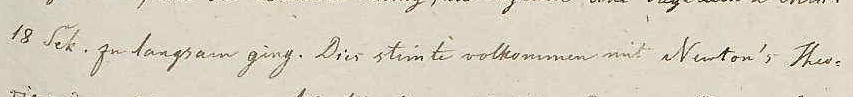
18 Sek. zu langsam ging. Dies stimte volkommen mit Newton's Theo-
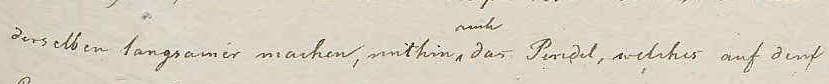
derselben langsamer machen, mithin auch das Pendel, welches auf demn
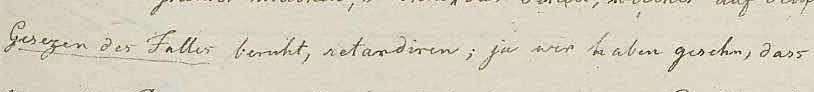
Gesezen des Falles beruht, retardiren; ja wir haben gesehn, dass
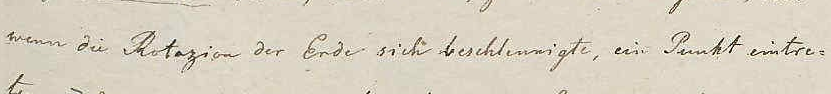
wenn die Rotazion der Erde sich beschleunigte, ein Punkt eintre-
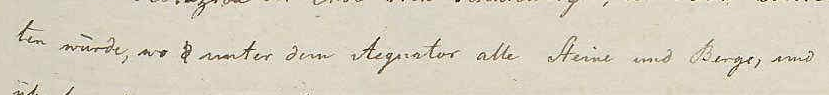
ten würde, wo d unter dem Aequator alle Steine und Berge, und
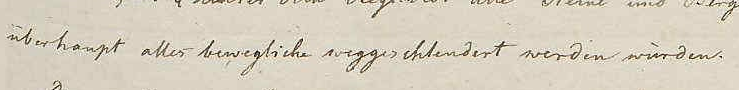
überhaupt alles bewegliche weggeschleudert werden würden.
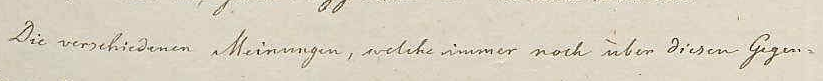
Die verschiedenen Meinungen, welche immer noch über diesen Gegen-
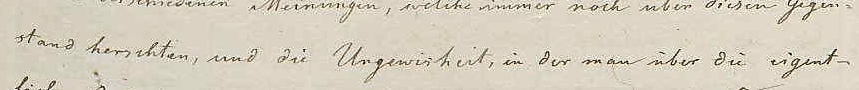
stand herschten, und die Ungewisheit, in der man über die eigent-
